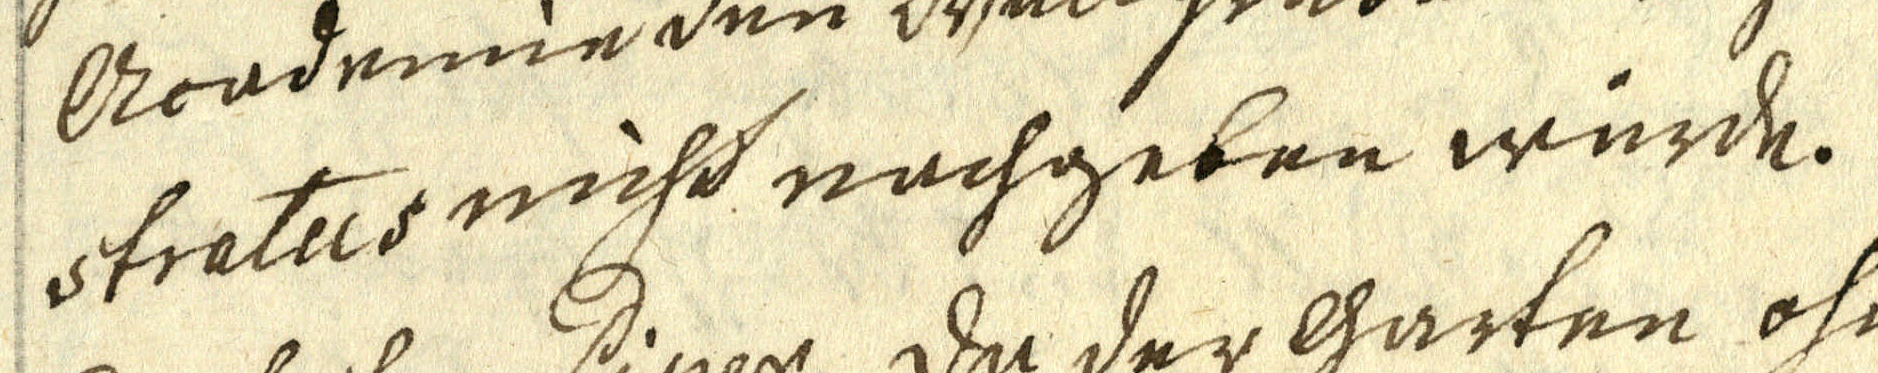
stratus nicht nachgeben würde.
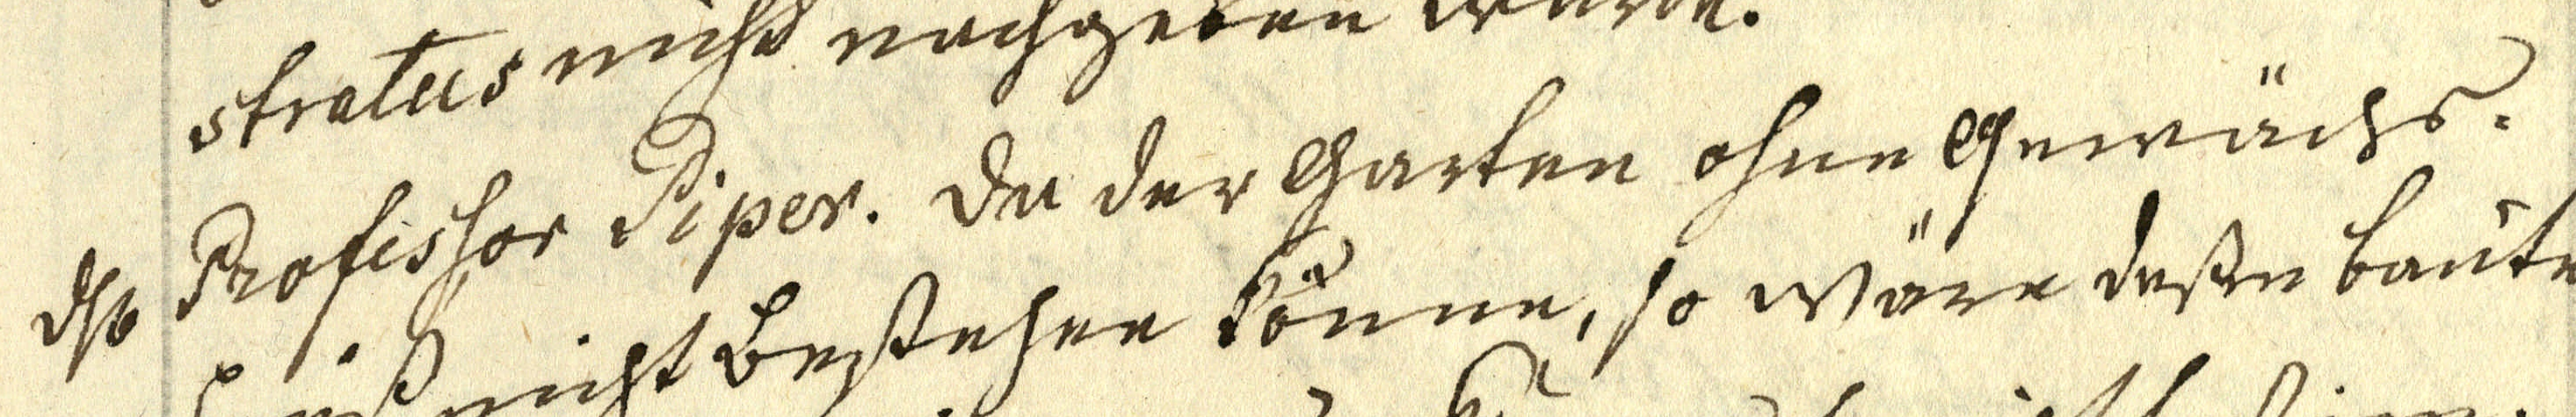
dh Professor Piper. Da der Garten ohne Gewächs¬
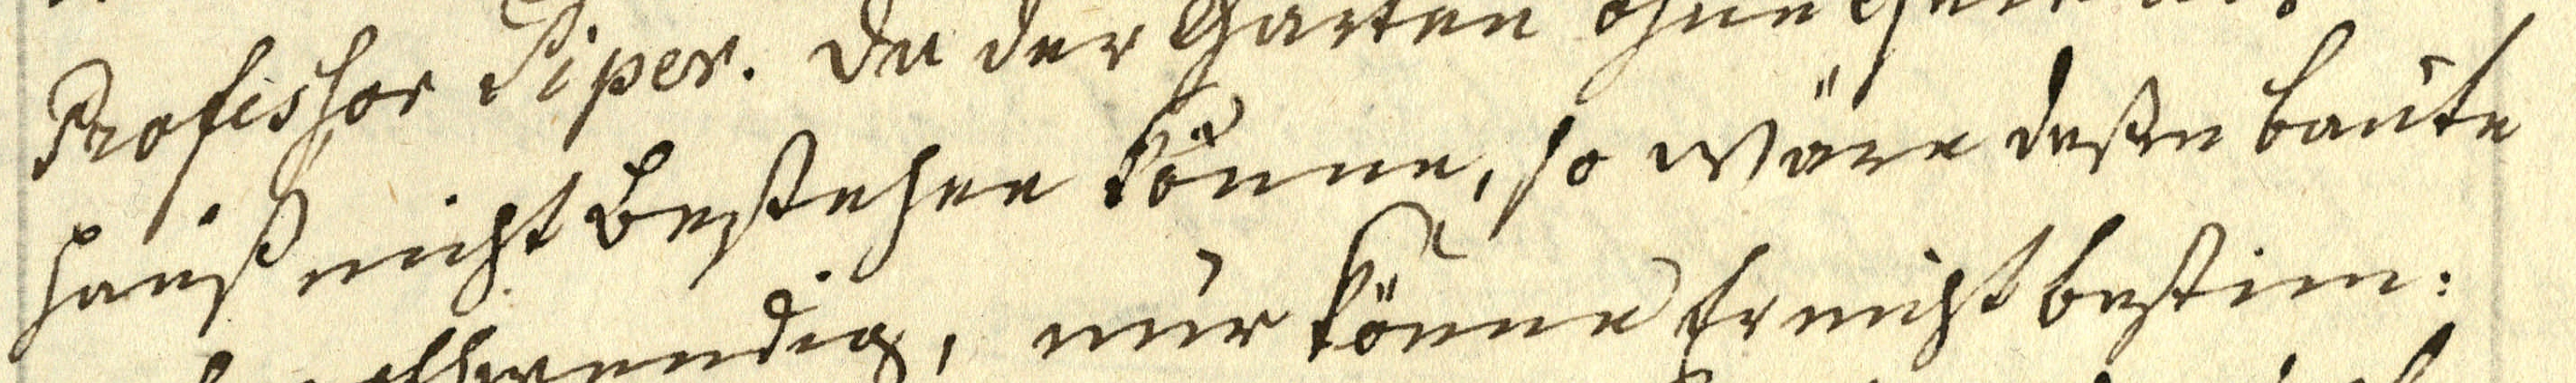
hauß nicht bestehen könne, so wäre deßen Baute
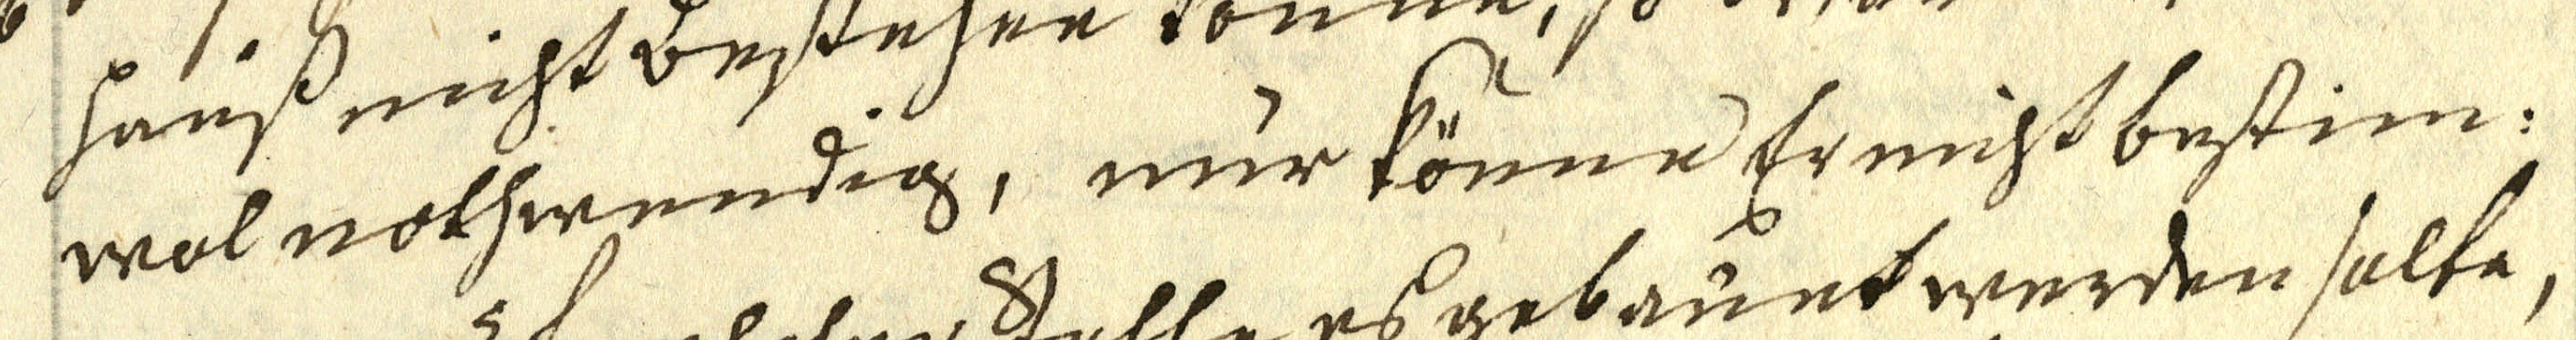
wol nothwendig, nur könne Er nicht bestim¬
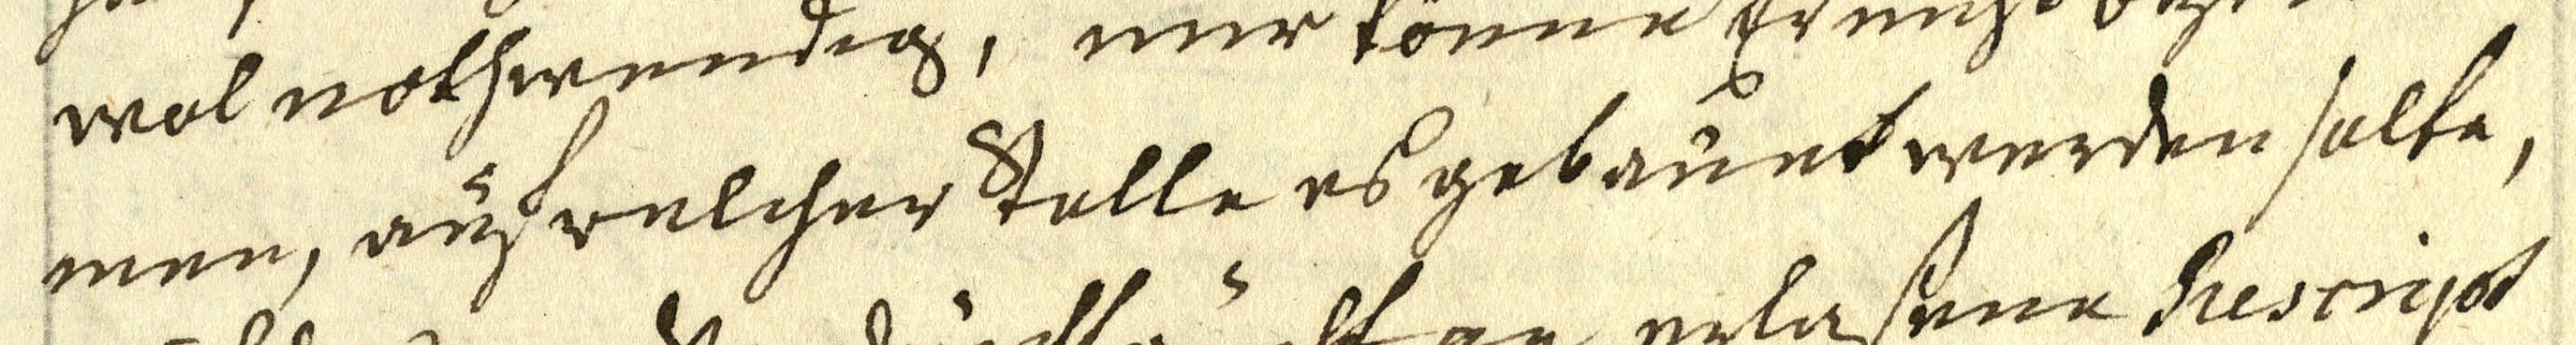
men, auf welcher Stelle es gebauet werden solte,
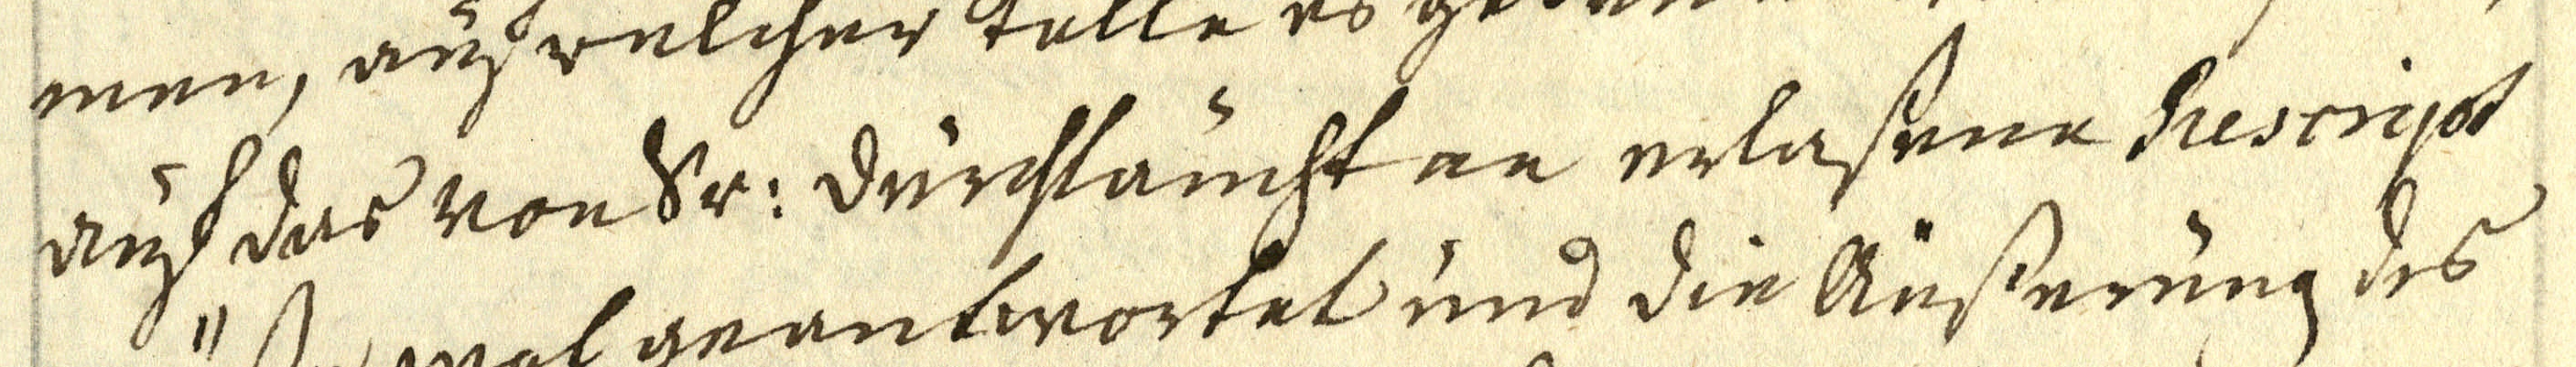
auf das von Durchlauchten erlaßene Rescript
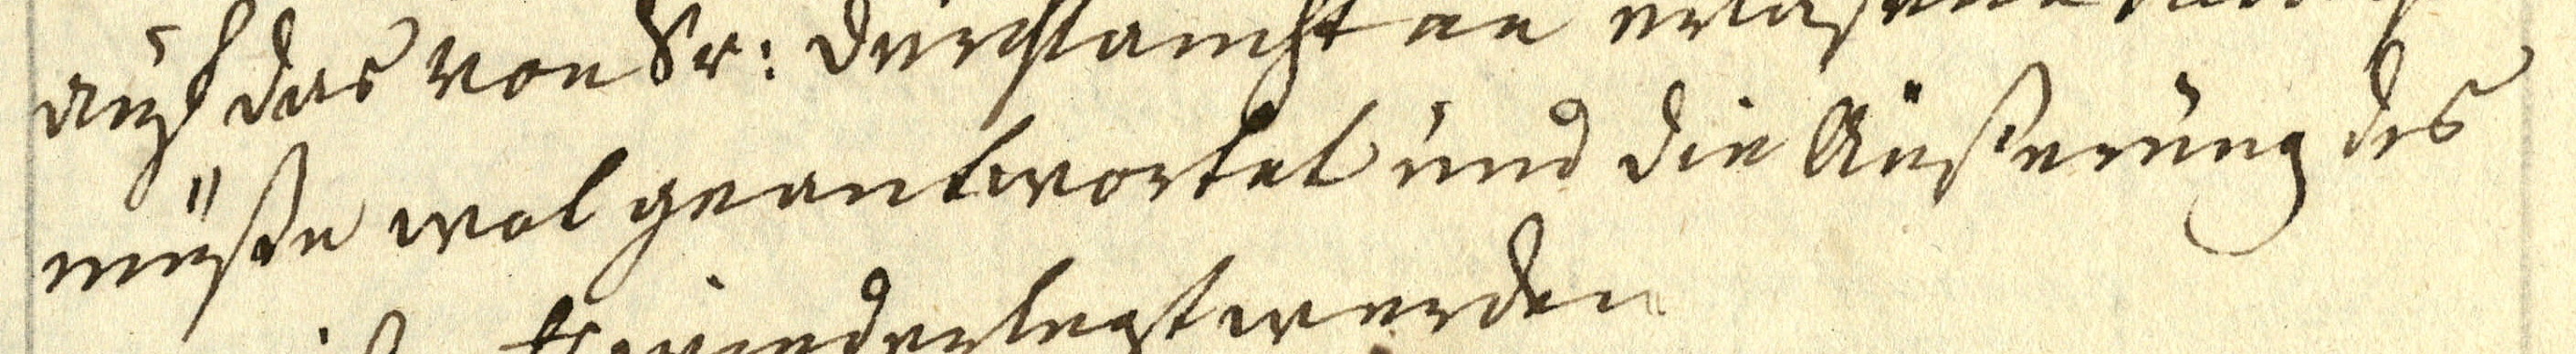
müße wol geantwortet und die Äußerung des
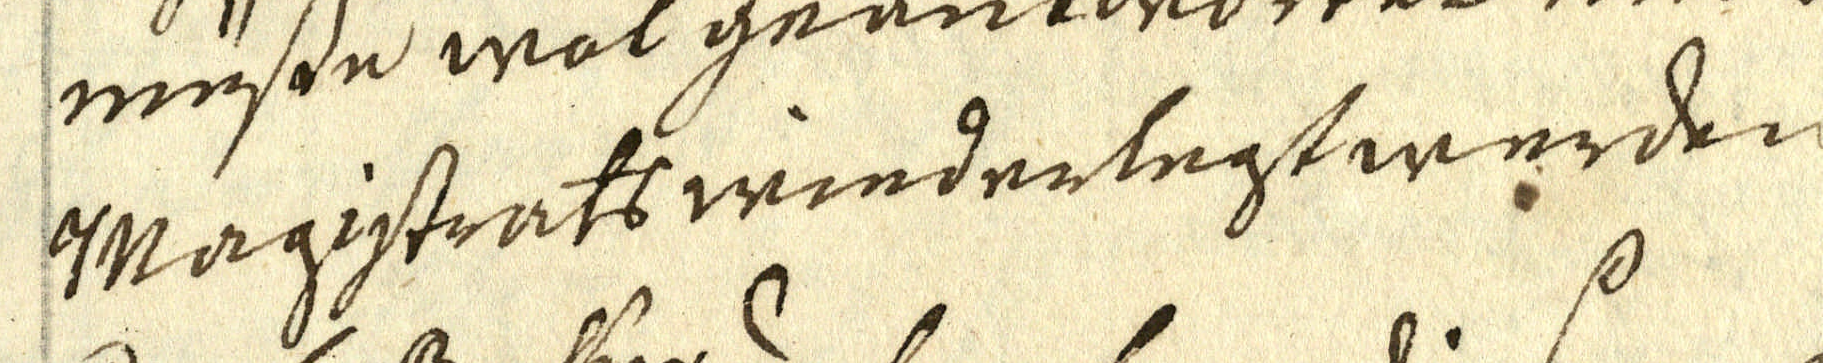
Magistrats wiederlegt werden.
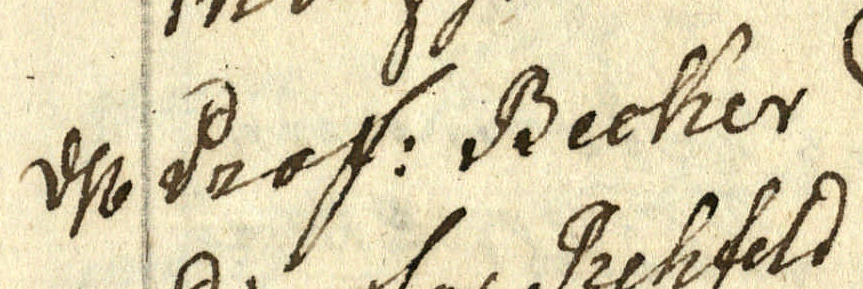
dh Prof. Becker
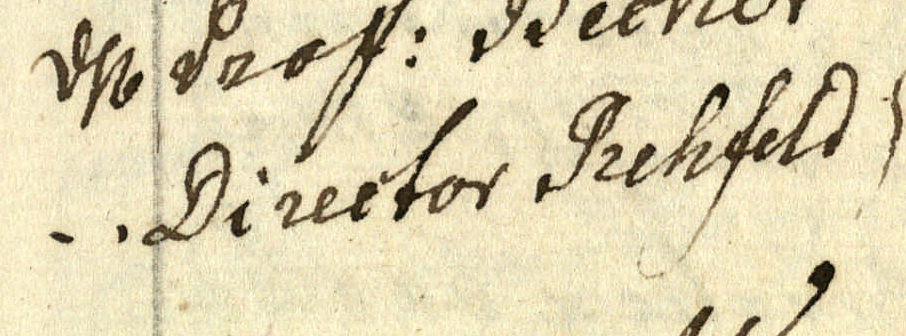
Director Rehfeld
